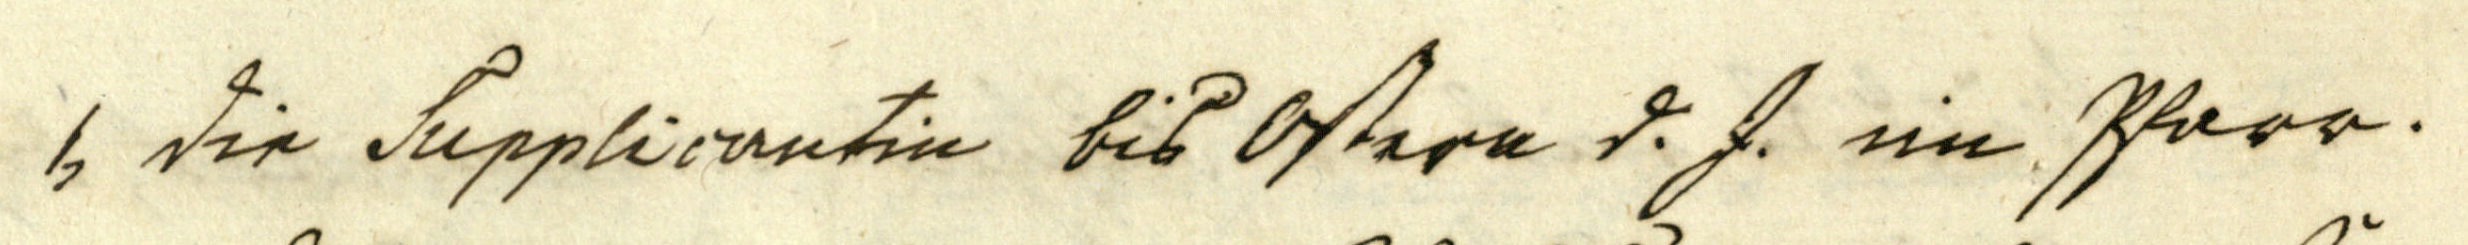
1, die Supplicantin bis Ostern d. J. im Pfarr¬
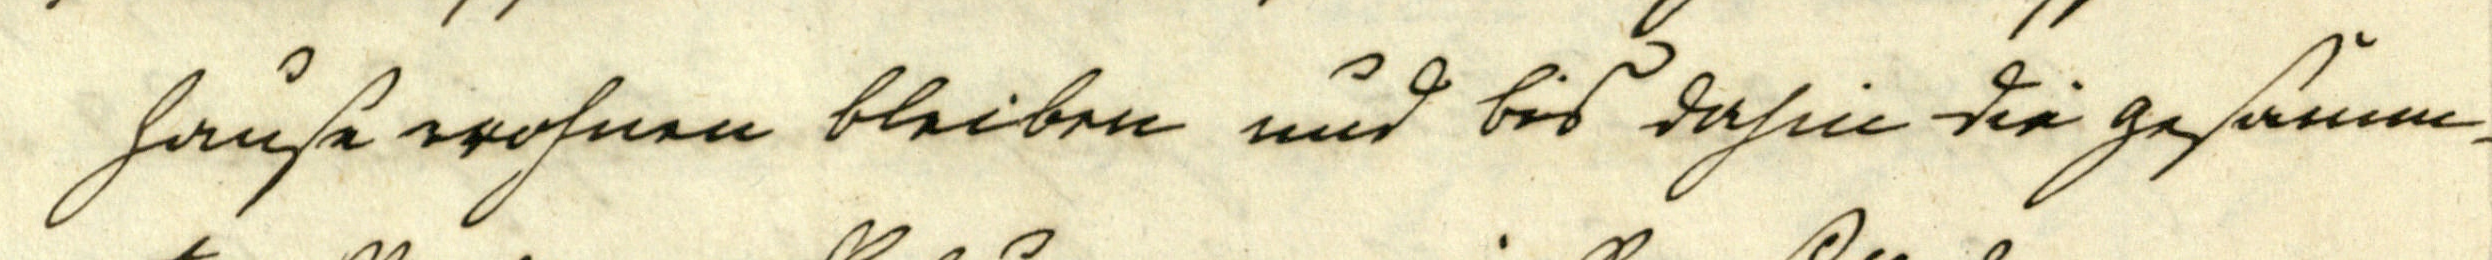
hause wohnen bleiben und bis dahin die gesamm¬
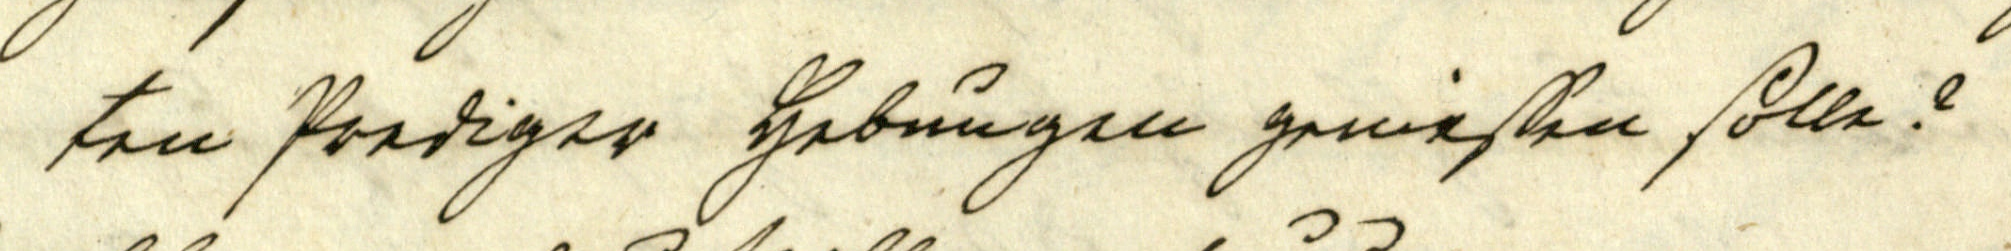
ten Prediger Hebungen geniessen solle?
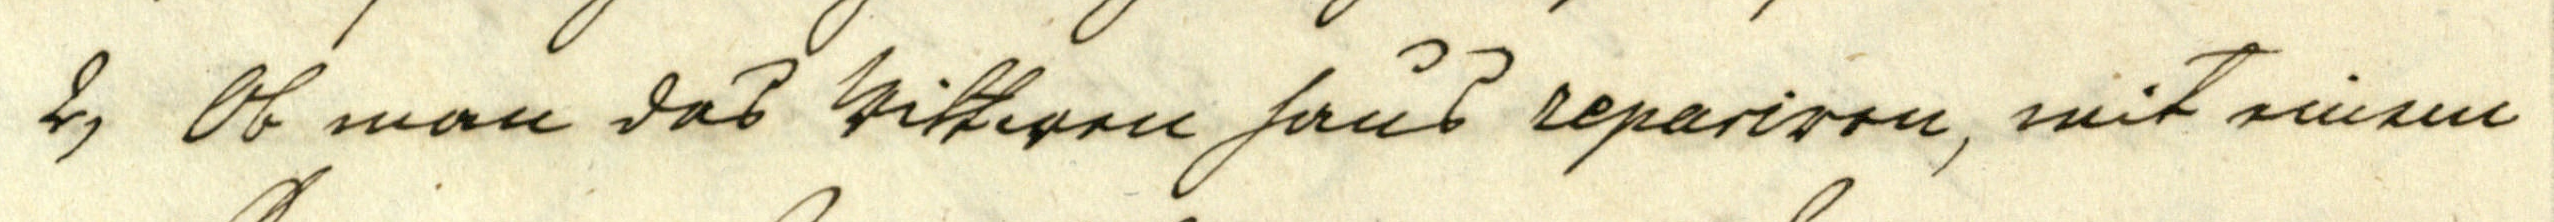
2., Ob man das Wittwen Haus repariren, mit einem
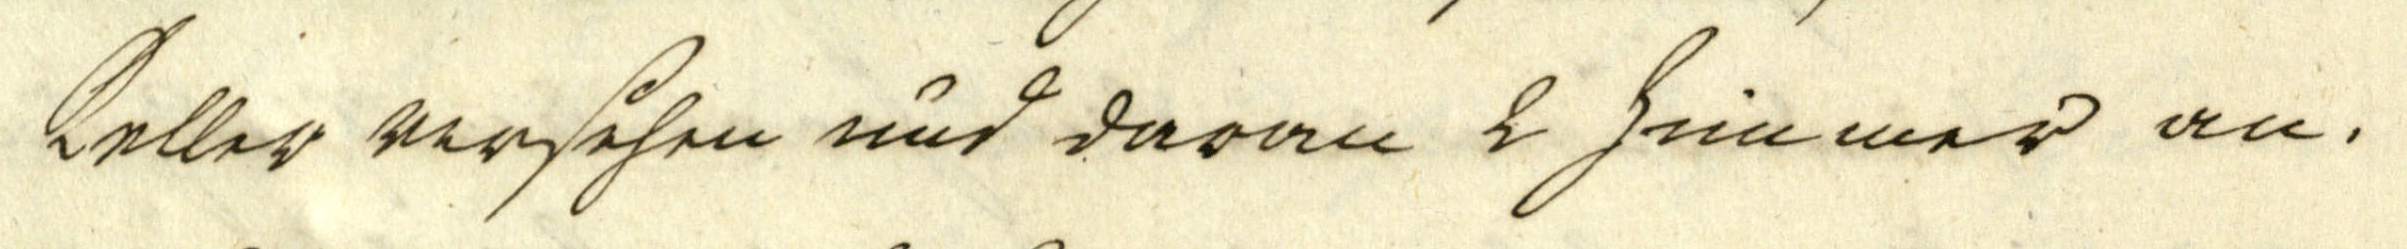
Keller versehen und daran 2 Zimmer an¬
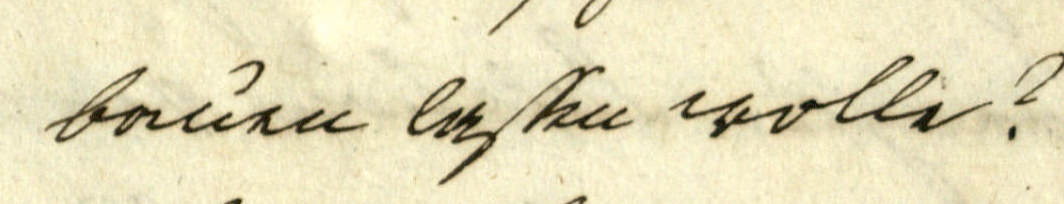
bauen lassen wolle?
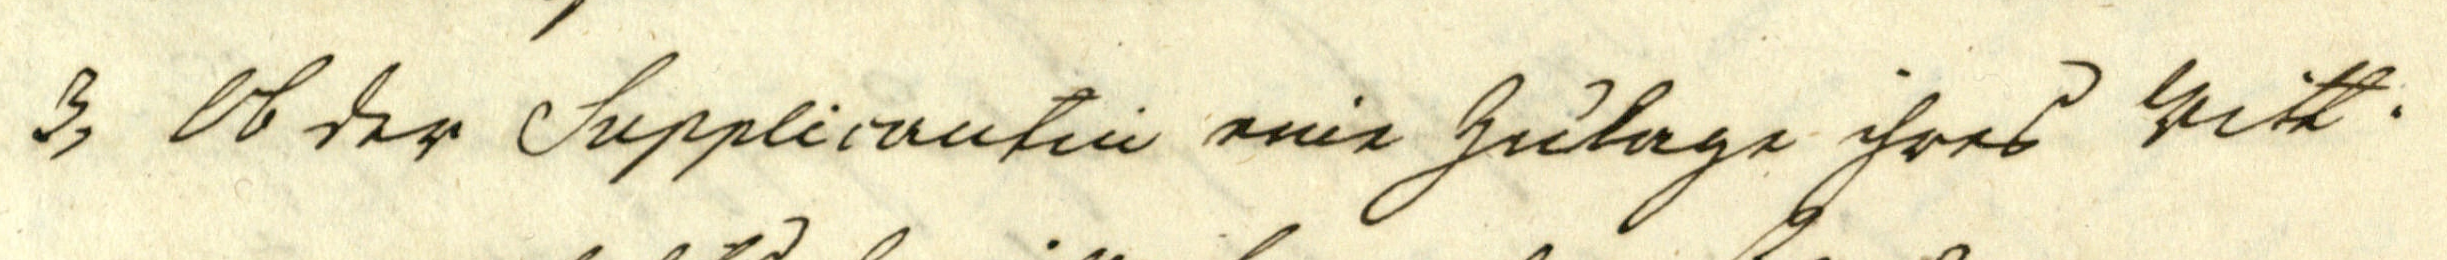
3., Ob der Supplicantin eine Zulage ihres Witt¬
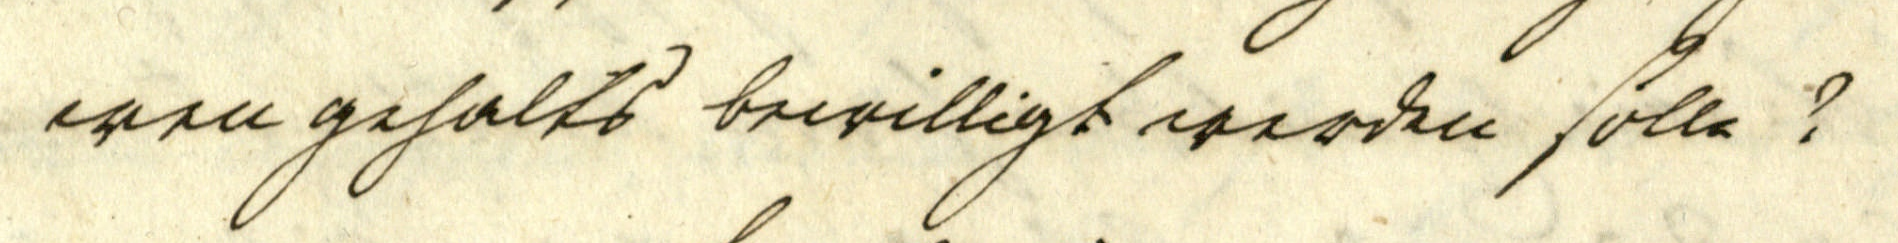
wen gehalts bewilligt werden solle?
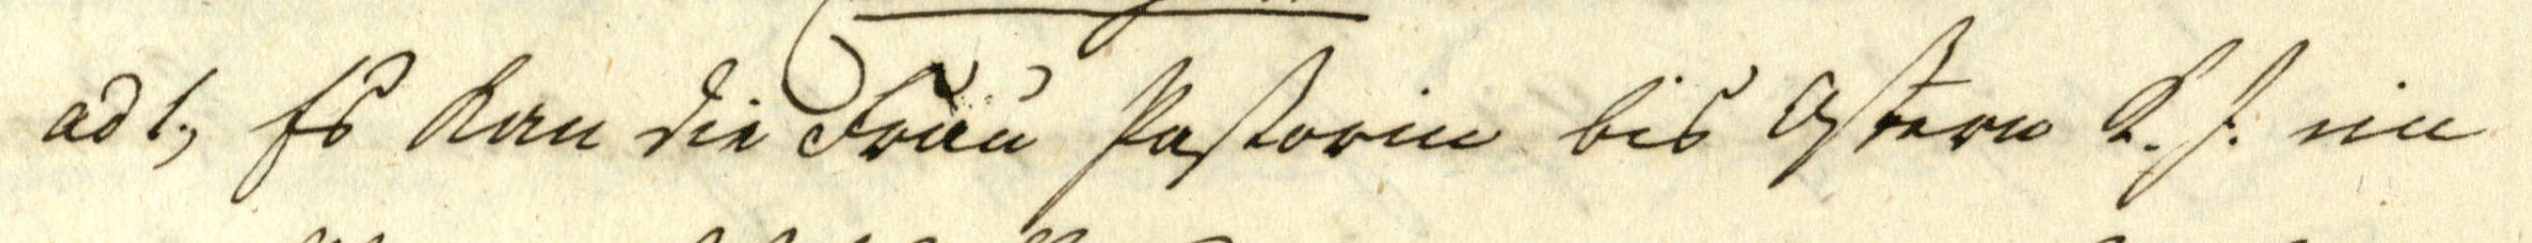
ad 1, Es kan die Frau Pastorin bis Ostern k. J. im
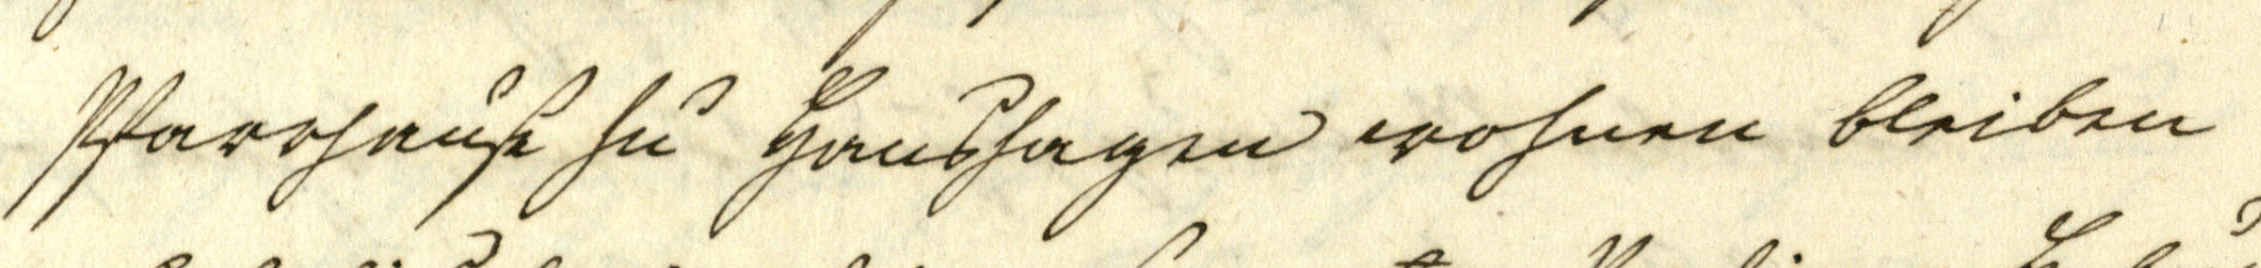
Pfarrhaus zu Hanshagen wohnen bleiben
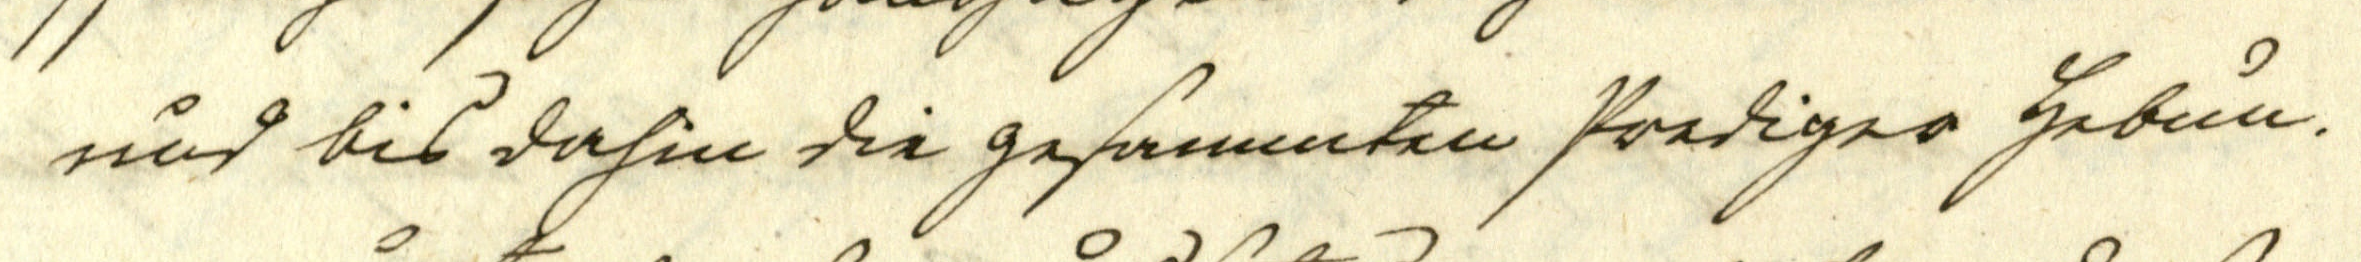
und bis dahin die gesammten Prediger Hebun¬
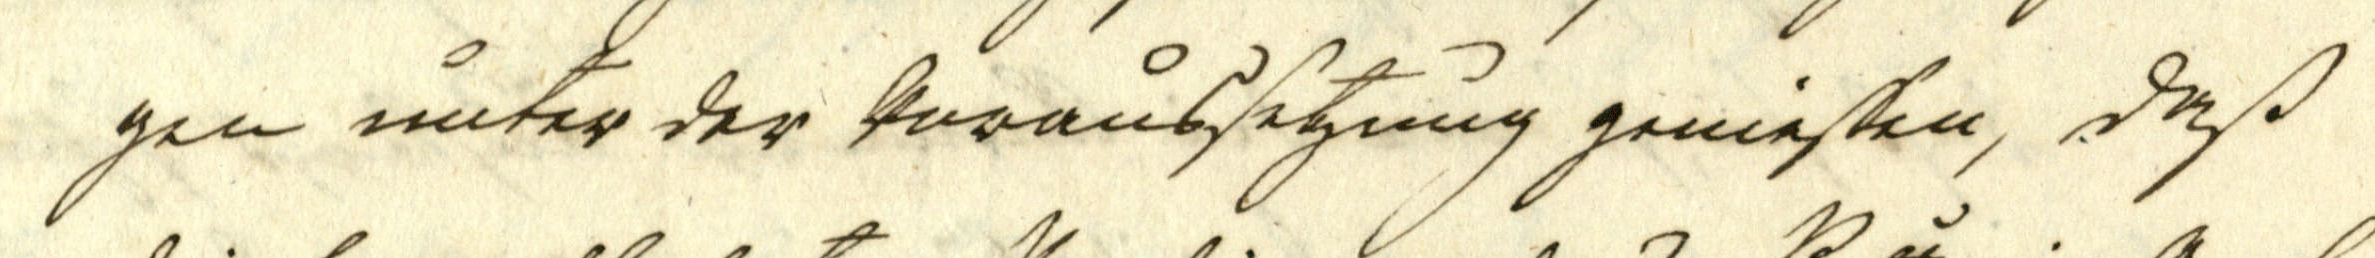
gen unter der Voraussetzung geniessen, daß
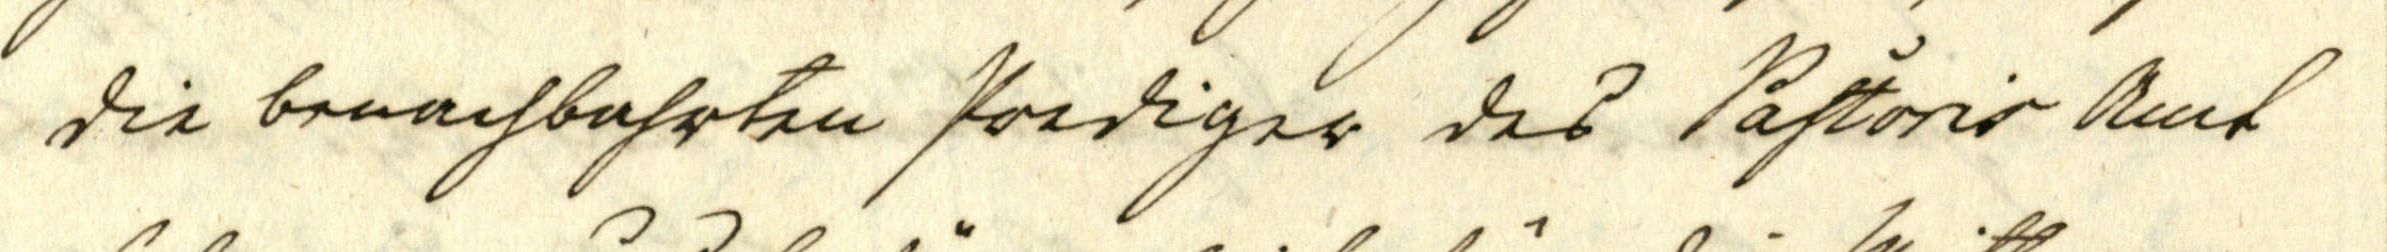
die benachbahrten Prediger des Pastors Amt
